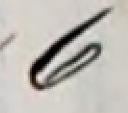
6
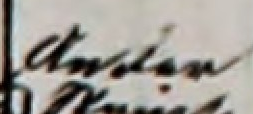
An der
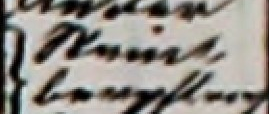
Stein„
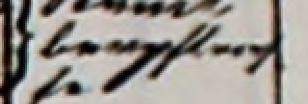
bergstras„
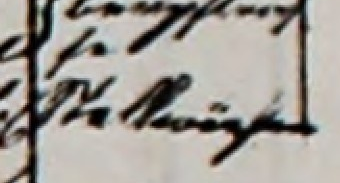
se
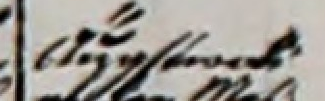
„
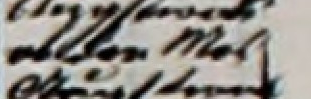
Augstrasse
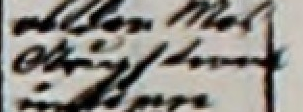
an der Mos
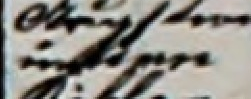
Augstrasse
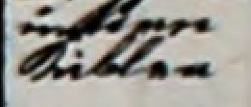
??? ???bler
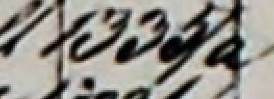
1335/a
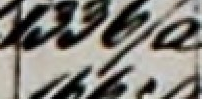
1336/a
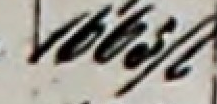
1665/b
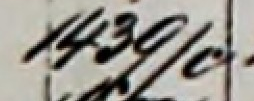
1439/c
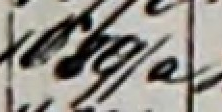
1689/a
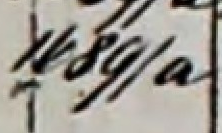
1689/a
